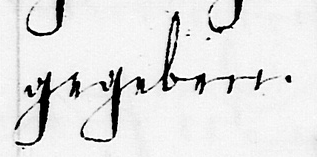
gegeben.
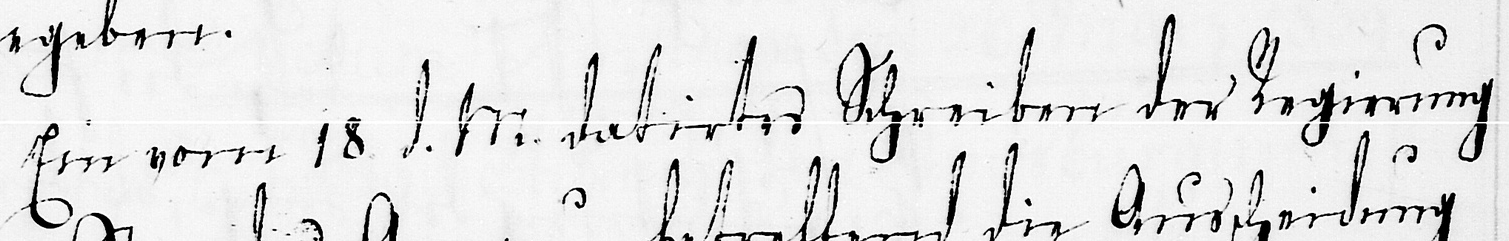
Ein vom 18. d. M. datirtes Schreiben der Regierung
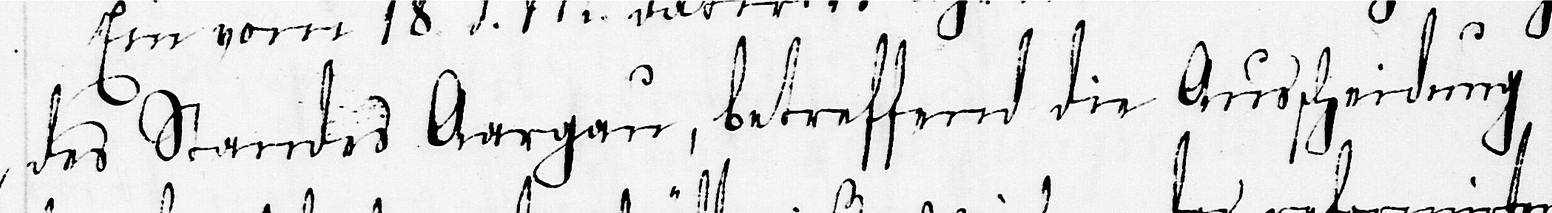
des Standes Aargau, betreffend die Ausscheidung
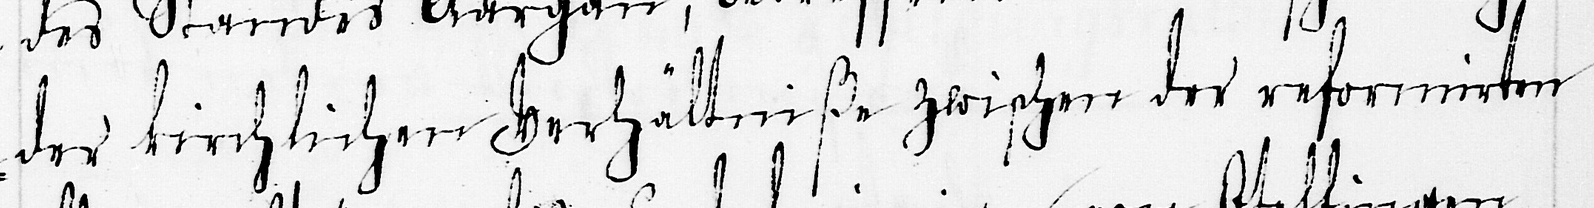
der kirchlichen Verhältniße zwischen der reformirten
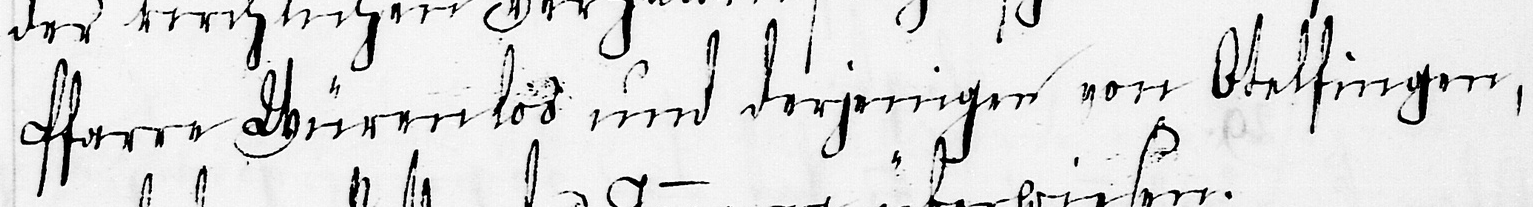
Pfarre Würenlos und derjenigen von Otelfingen,
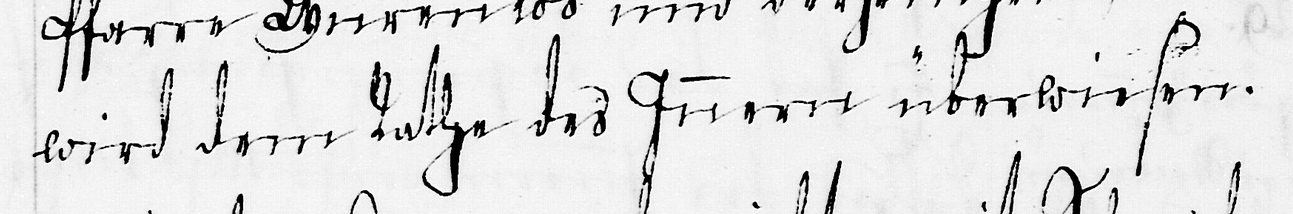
wird dem Rathe des Innern überwiesen.
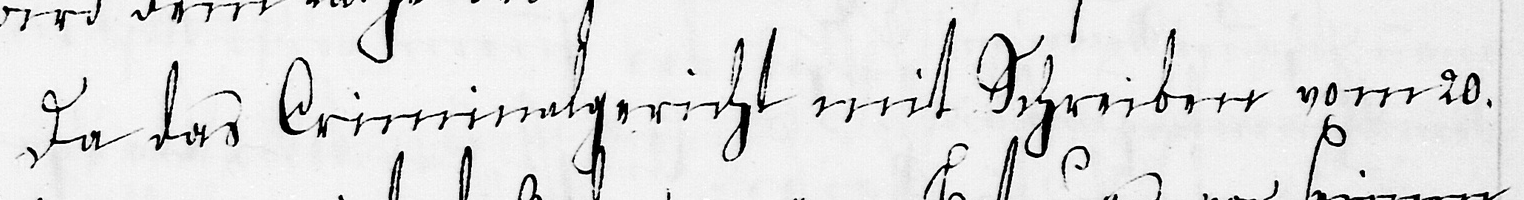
Da das Criminalgericht mit Schreiben vom 20.
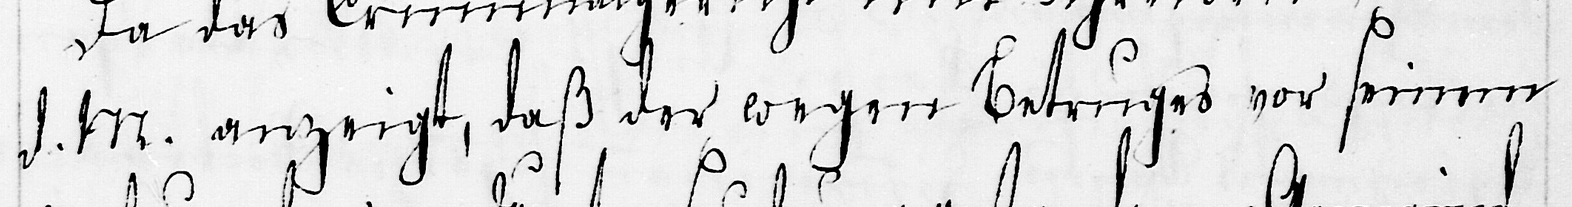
d. M. anzeigt, daß der wegen Betruges vor seinem
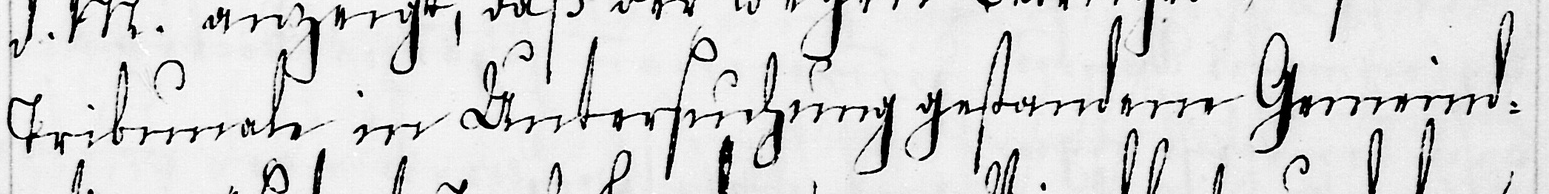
Tribunale in Untersuchung gestandene Gemeind¬
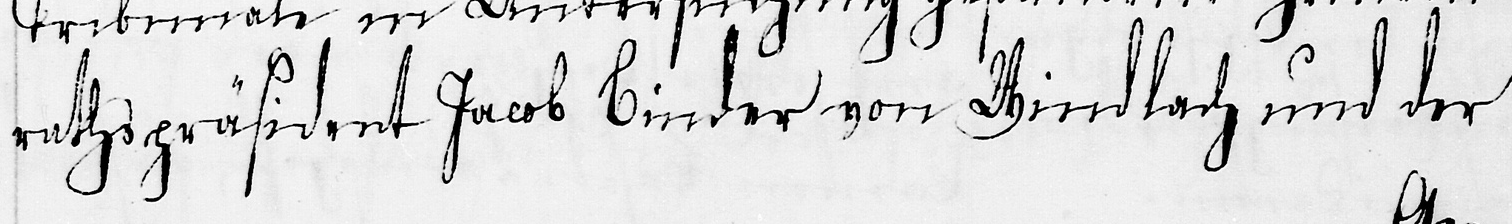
rathspräsident Jacob Binder von Windlach und der
